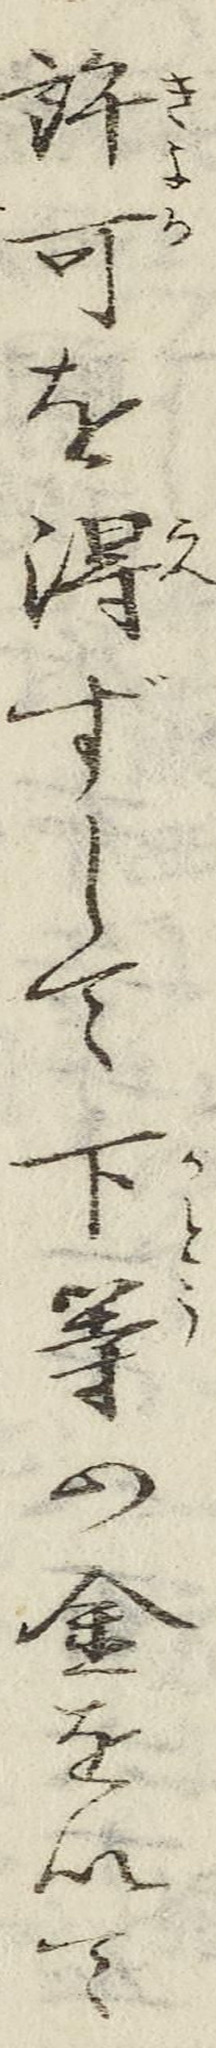許可を得ずして下等の金を以て
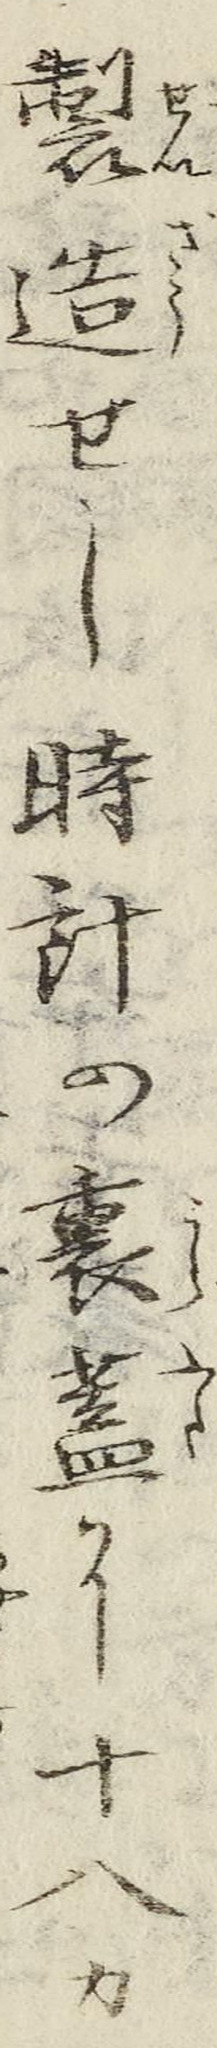製造せし時計の裏蓋に十八カ
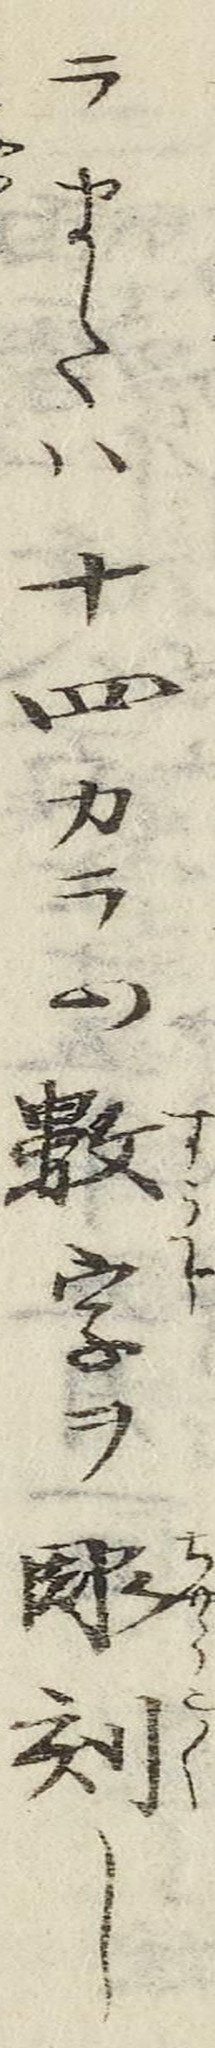ラまたは十四カラの数字を彫刻し
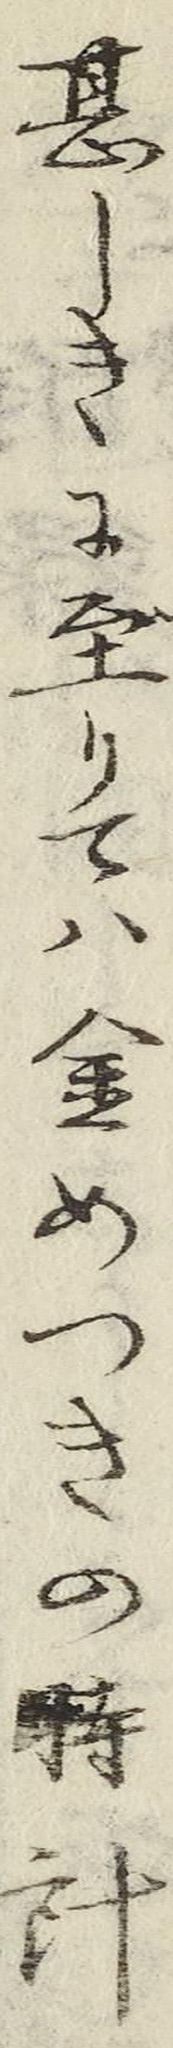甚しきに至りては金めつきの時計
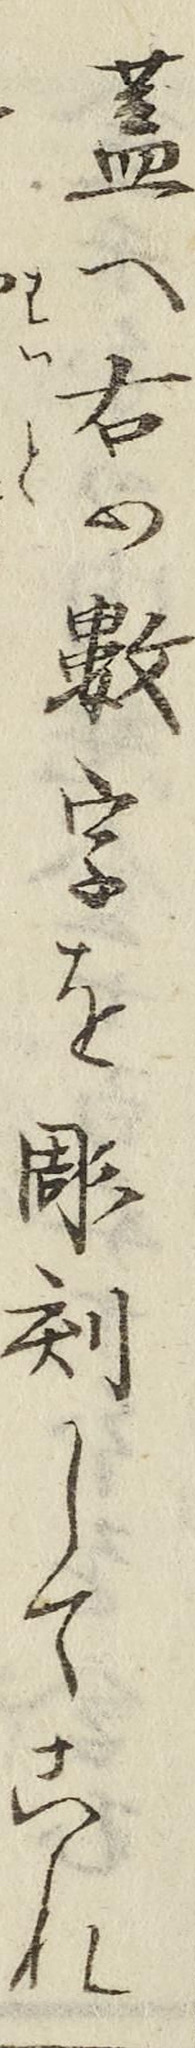蓋へ右の数字を彫刻してこれ
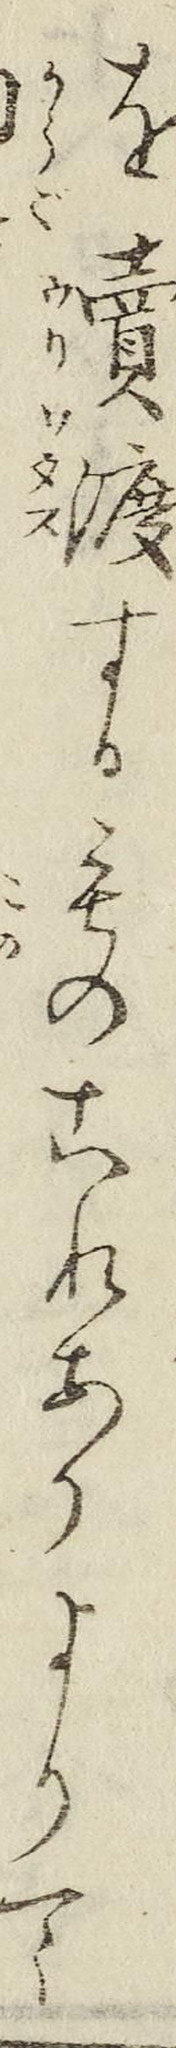を売渡するものこれありよりて
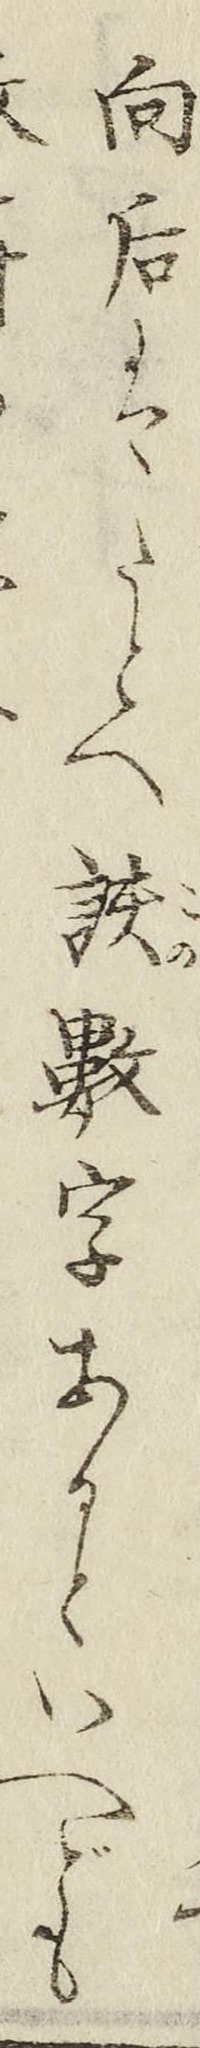向后はたとへ該数字あるといへども
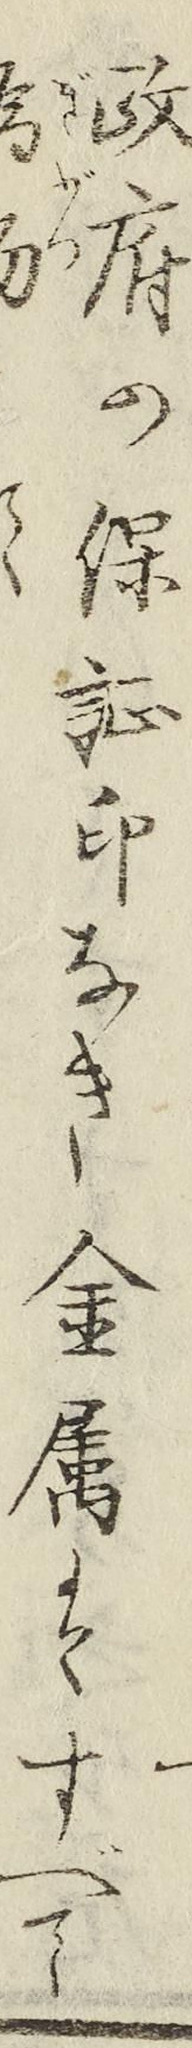政府の保証印なき金属はすべて
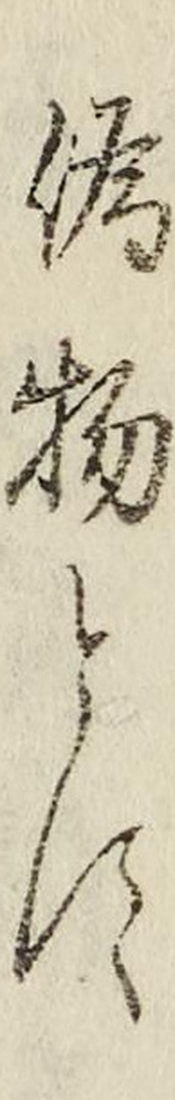偽物とす
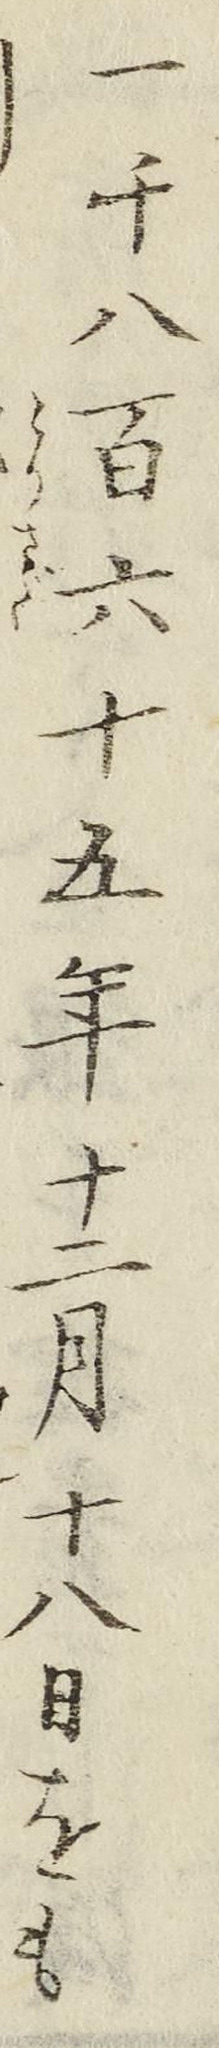一千八百六十五年十二月十八日をも
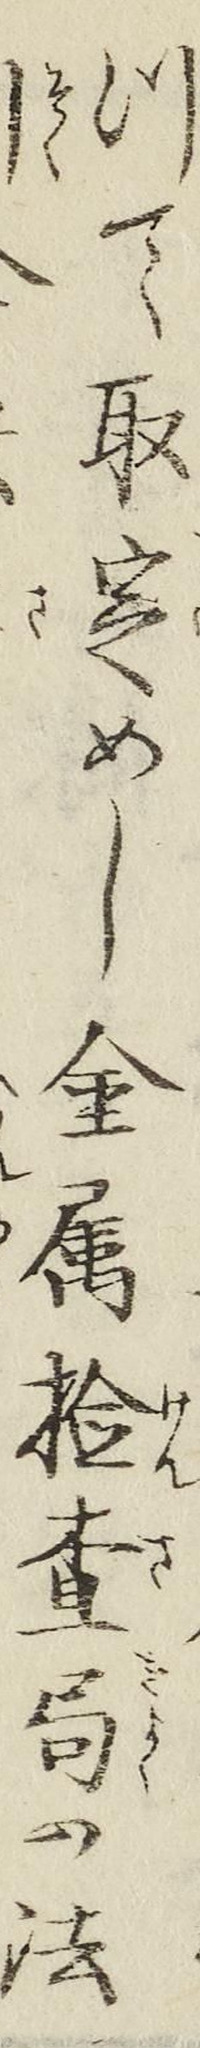つて取定めし金属検査局の法
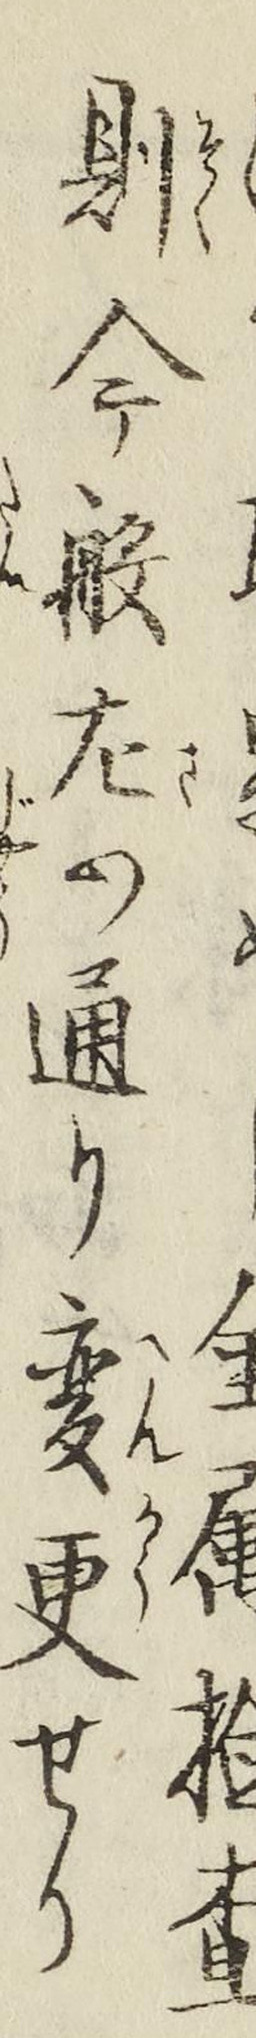則今般左の通り変更せり
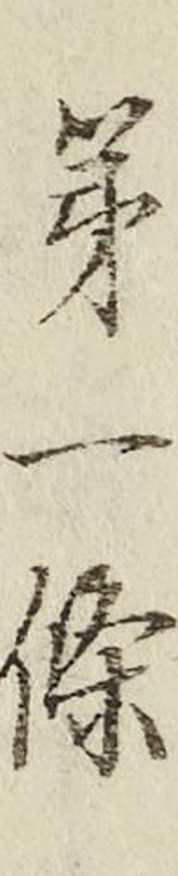第一條
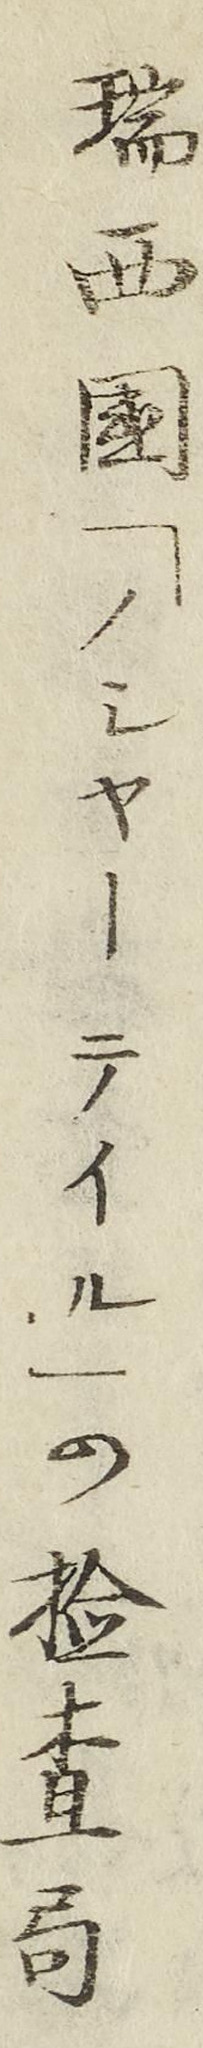瑞西国「ノシヤーテイル」の検査局

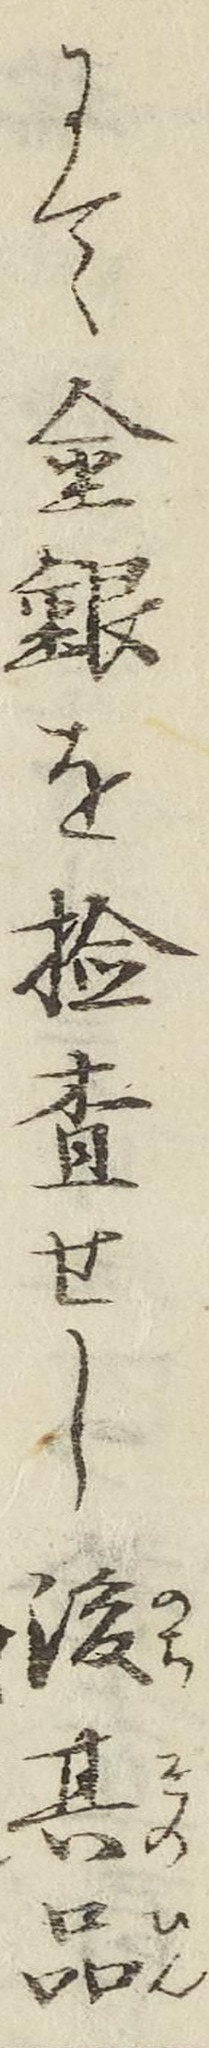にて金銀を検査せし後其品
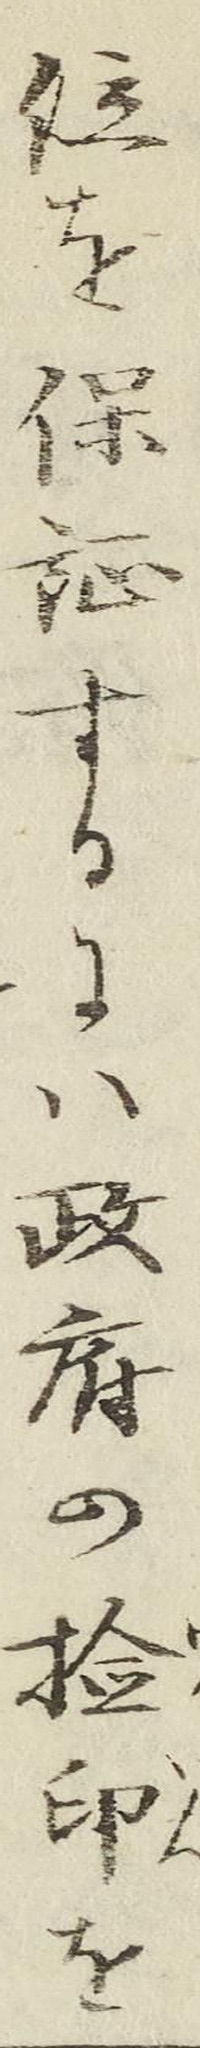位を保証するには政府の検印を
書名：[時計に関する冊子]
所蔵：東京大学地震研究所図書室 Earthquake Research Institute Library, The University of Tokyo, JAPAN
